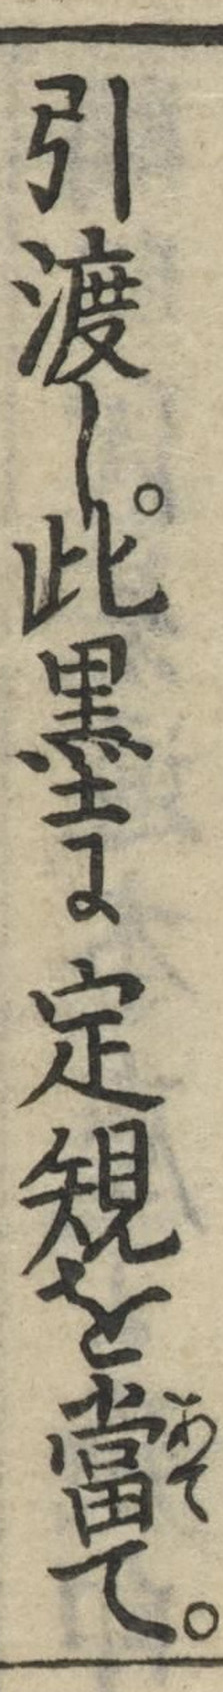引渡し。此墨に定規を當て。

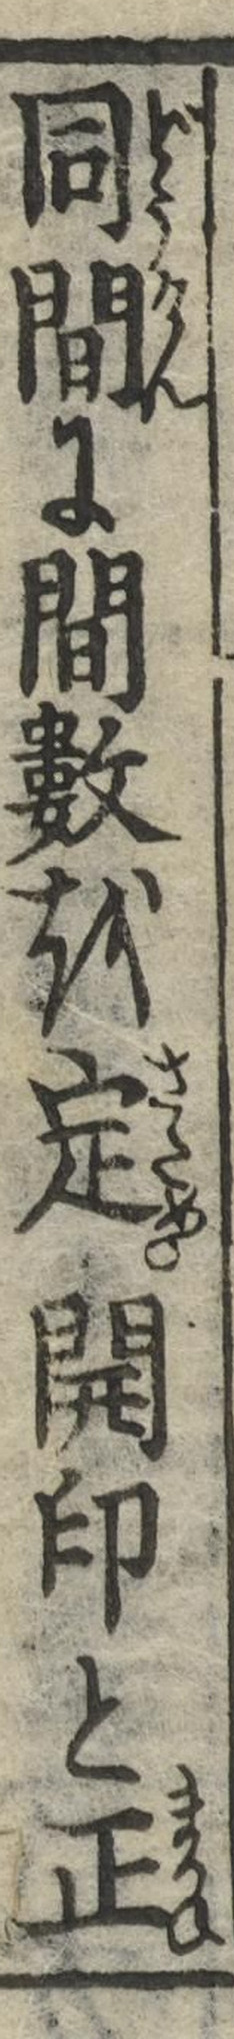同間に間數を定開印と正

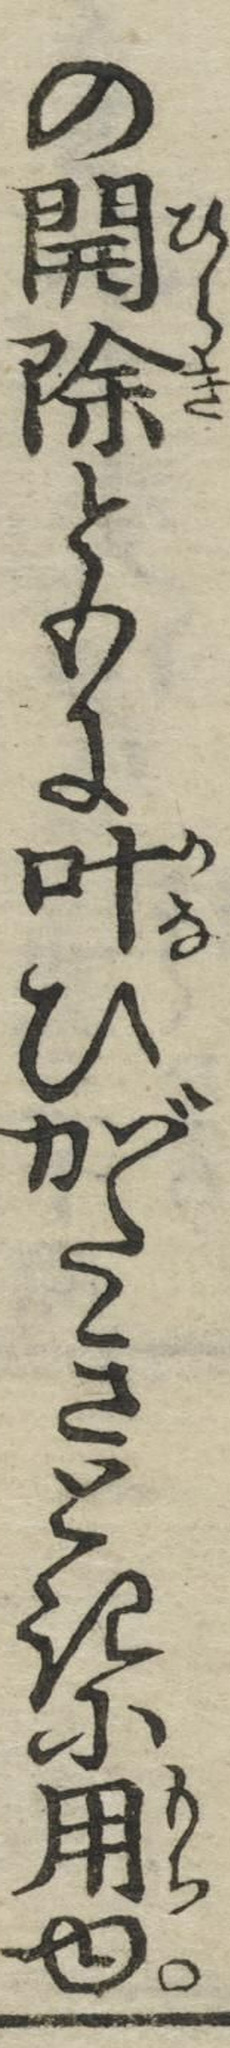の開除ともに叶ひがたきときに用ゆ。
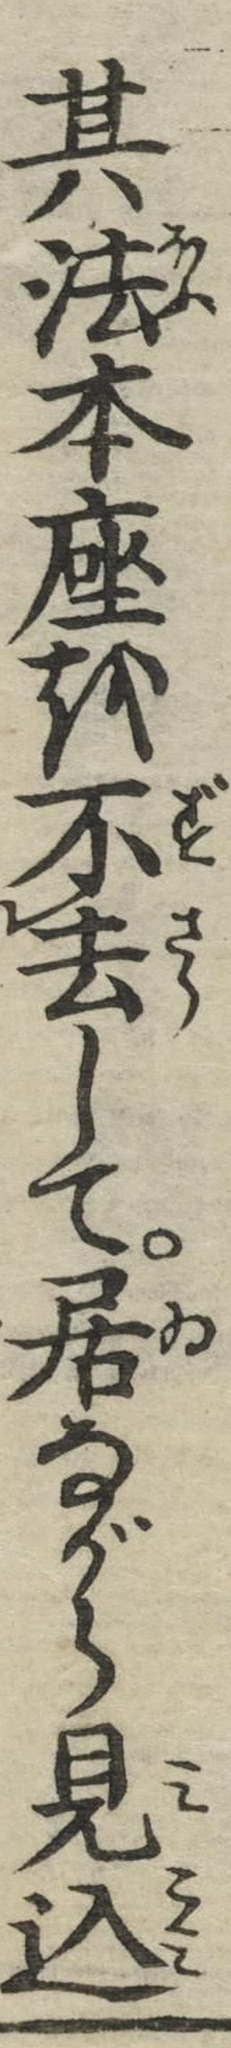其-法本座を不去して。居ながら見込
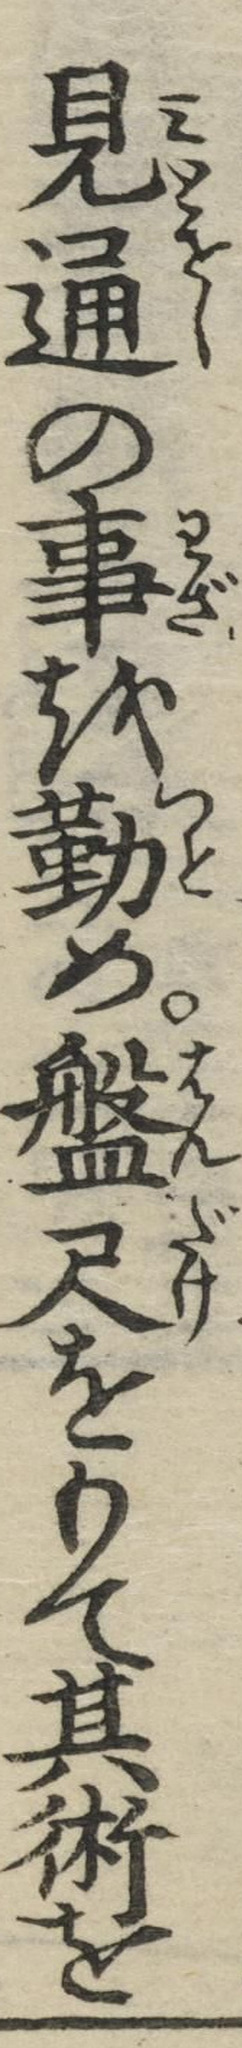見通の事を勤め。盤尺をもて其術を
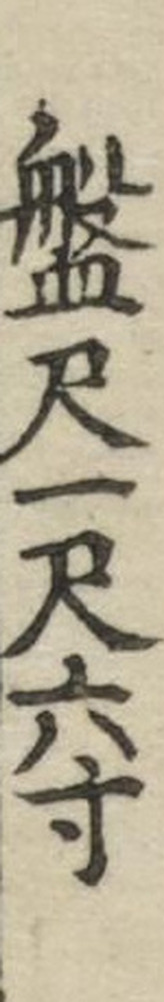盤尺一尺六寸
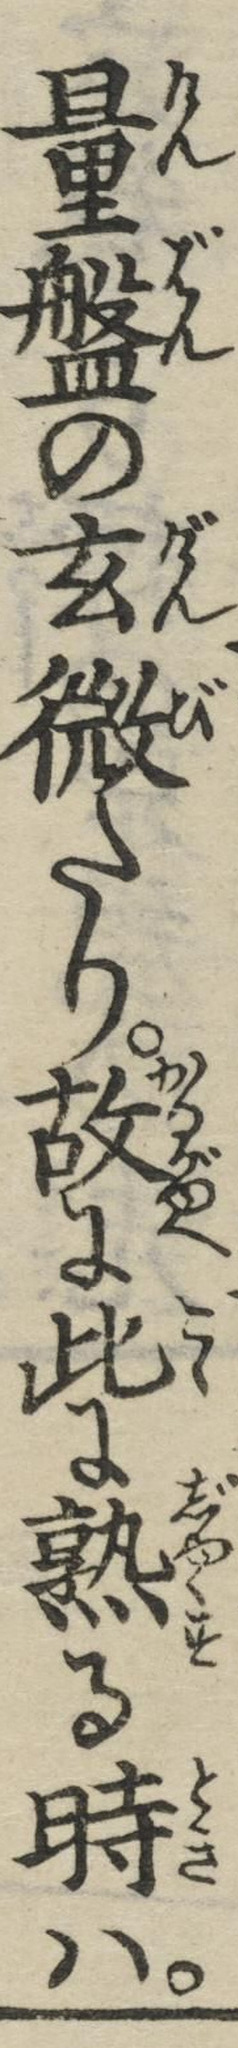量盤の玄微たり。故に此に熟る時は。
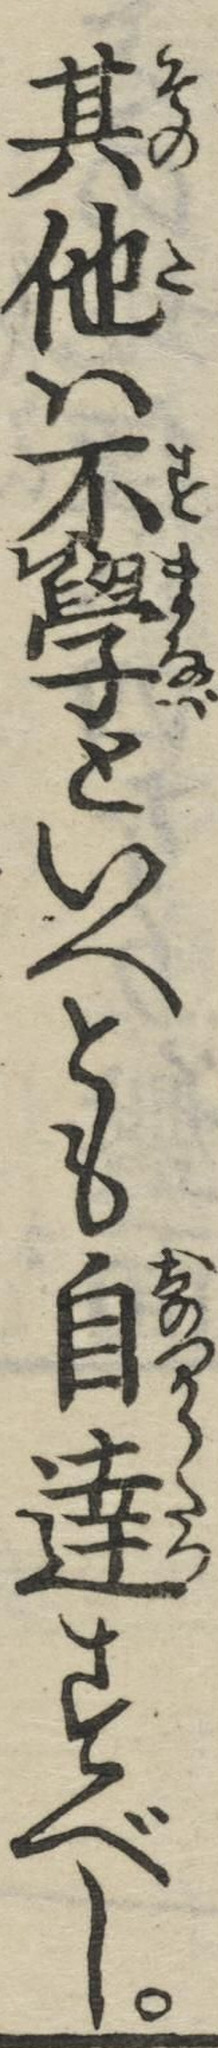其他は不学といへとも自達すべし。

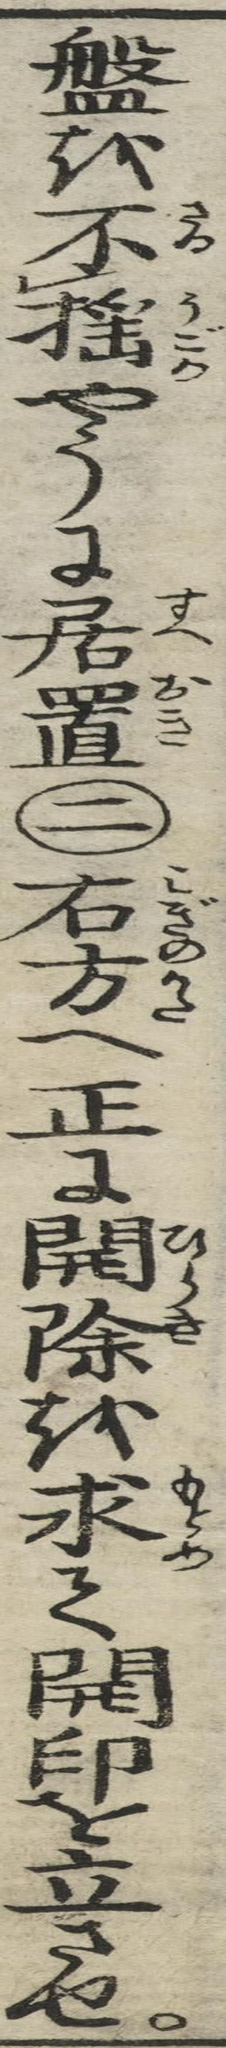盤を不揺やうに居置㊁右方へ正に開除を求て開印を立させ。
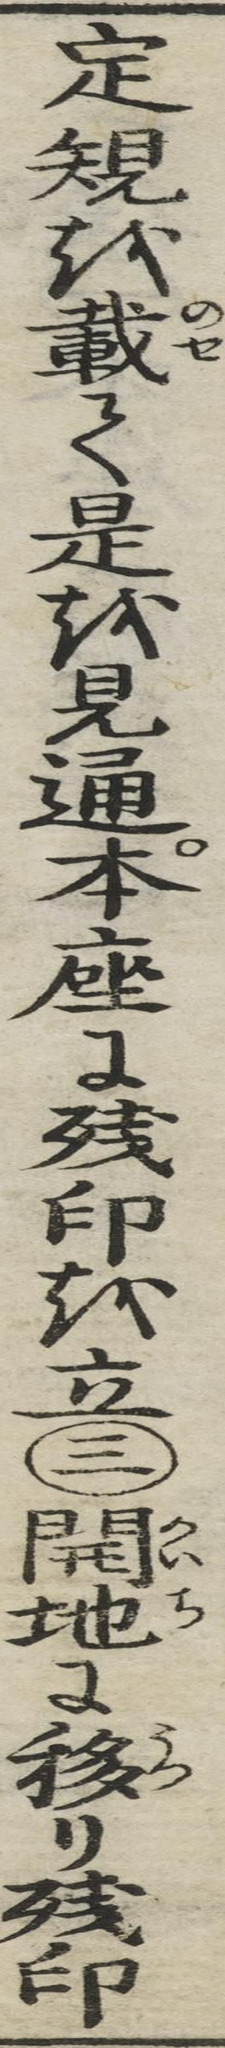定規を載て是を見通。本座に残印を立㊂開地に移り残印
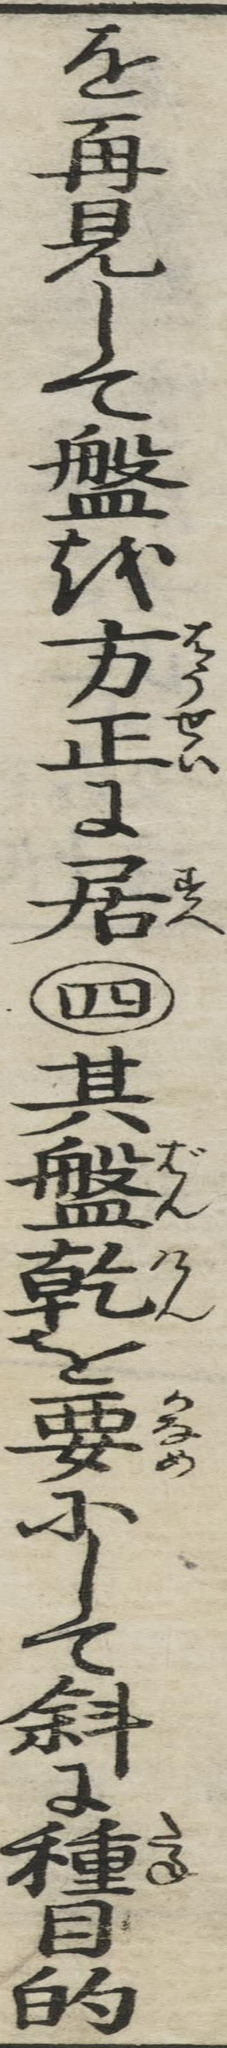を再見して盤を方正に居㊃其盤乾を要にして斜に種目的
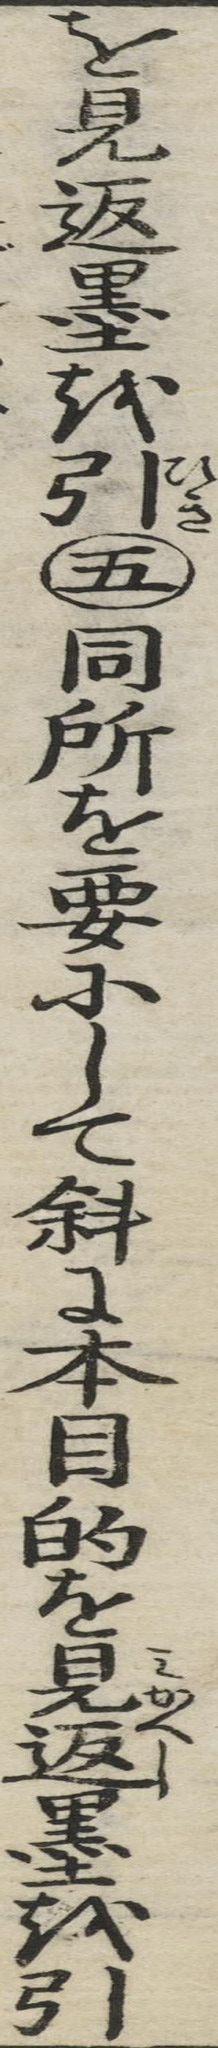を見返墨を引㊄同所を要にして斜に本目的を見返墨を引
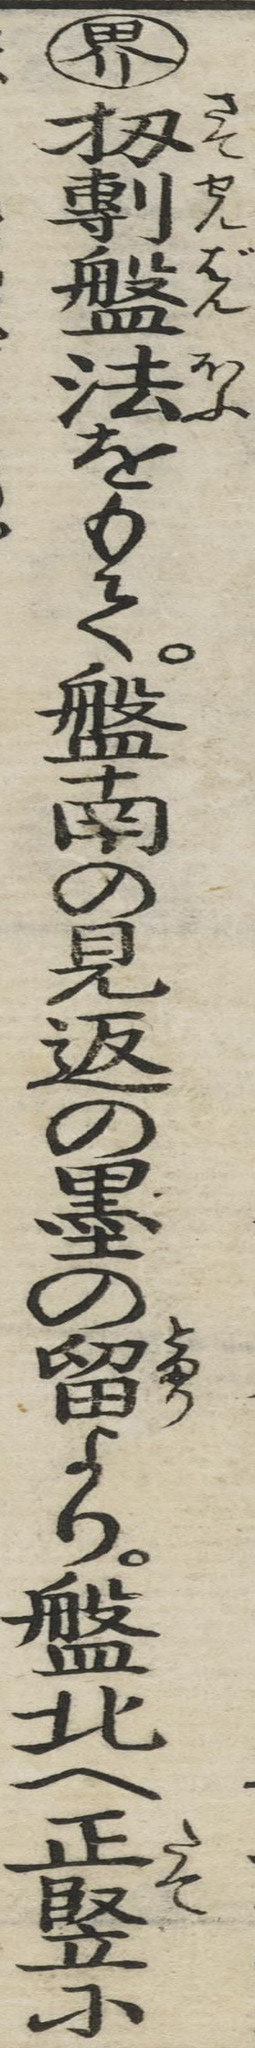扨剸盤法をもて。盤南の見返の墨の留より。盤北へ正堅に
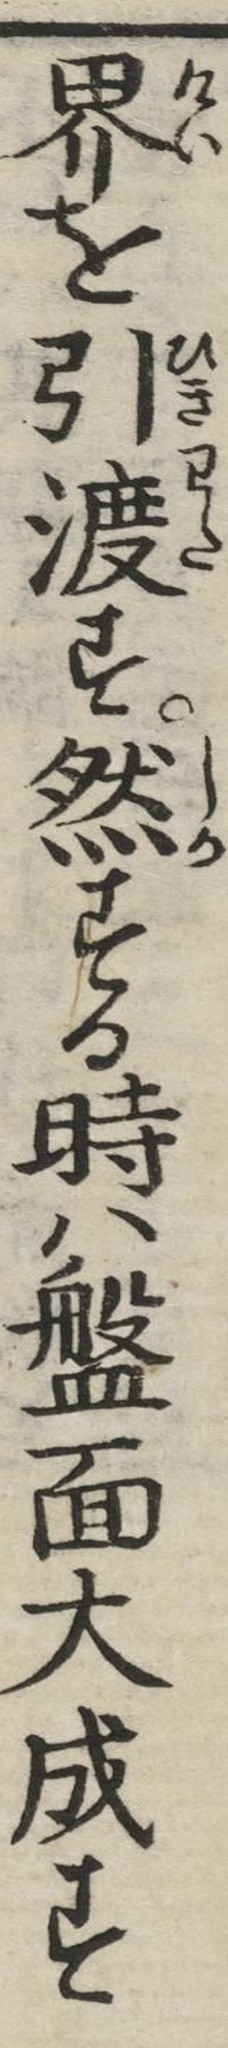界を引渡す。然する時は盤面大成す
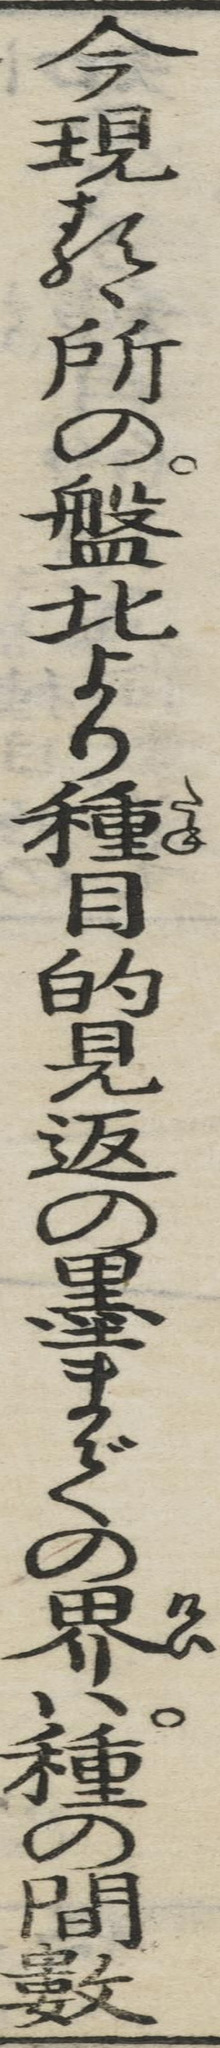今現るヽ所の。盤北より種目的見返の墨までの界は。種の間数
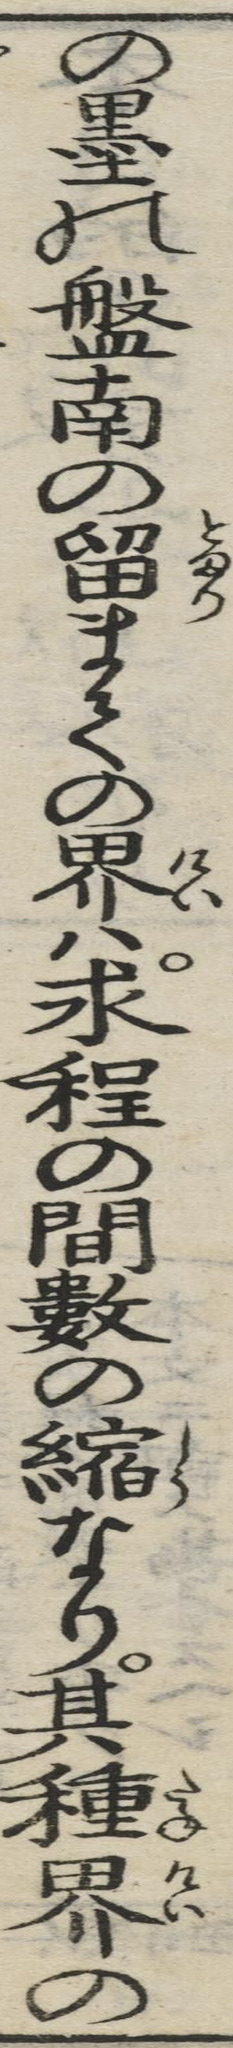の墨の盤南の留まての界は。求程の間数の縮なり。其種界の
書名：量地指南　巻之二（内題）
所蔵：東京大学地震研究所図書室 Earthquake Research Institute Library, The University of Tokyo, JAPAN
